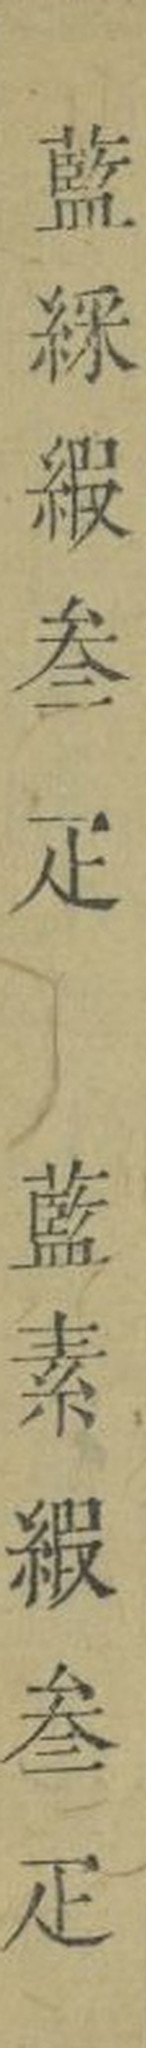藍綵縀参疋藍素縀参疋
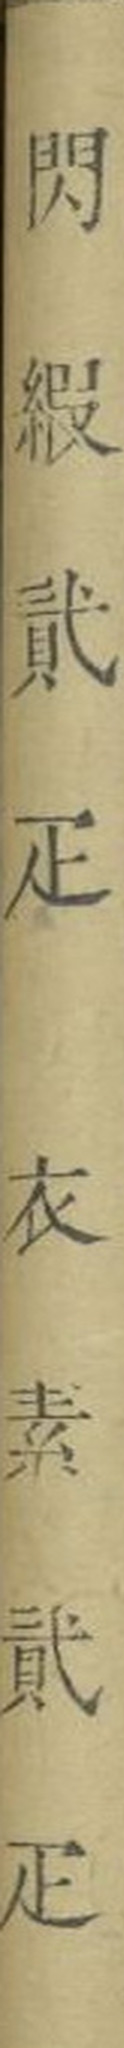閃縀貮疋衣素貮疋
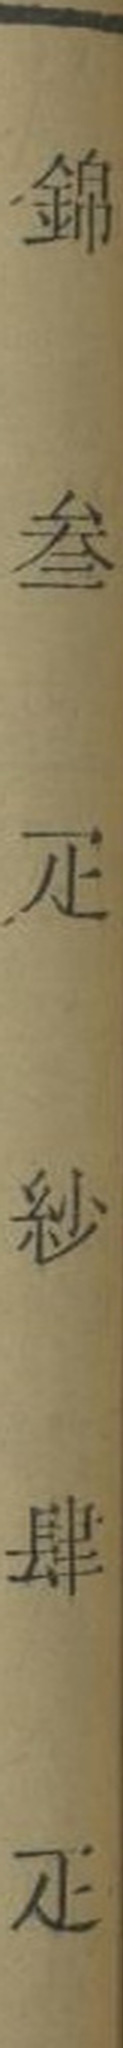錦参疋紗肆疋
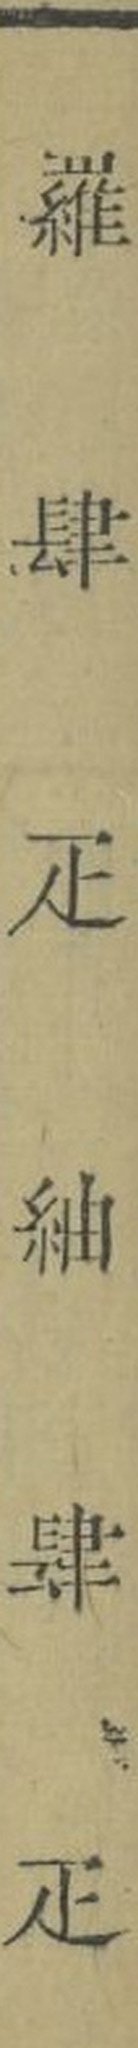羅肆疋紬肆疋
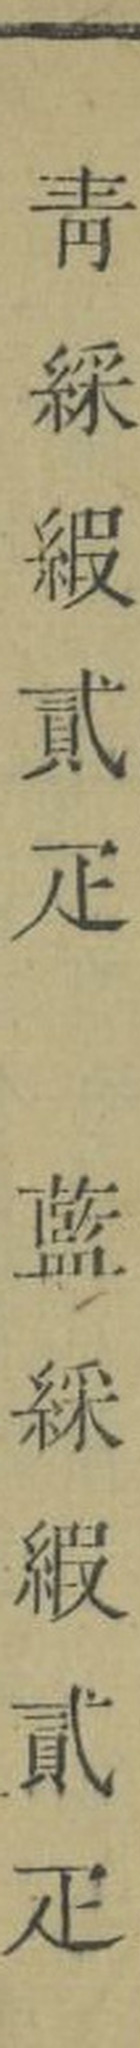靑綵縀貳疋藍綵縀貳疋
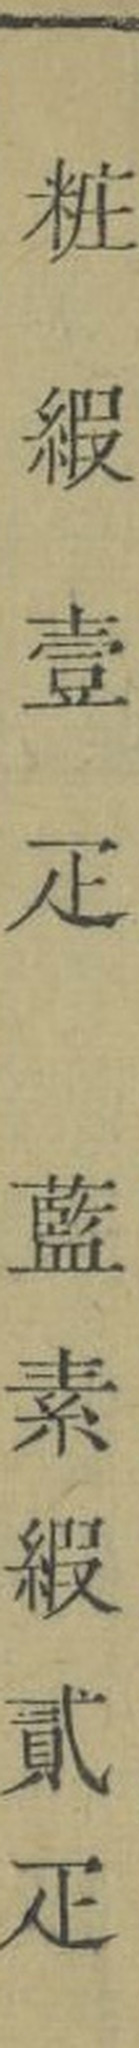粧縀壹疋藍素縀貳疋
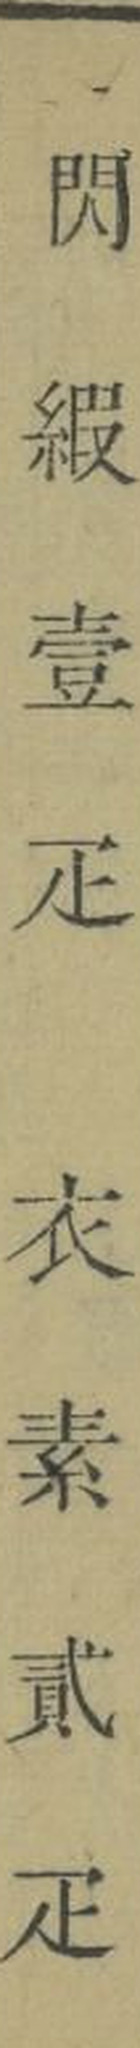閃縀壹疋衣素貳疋
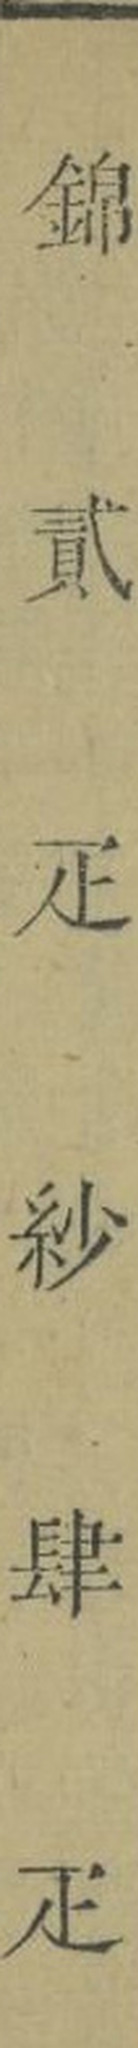錦貳疋紗肆疋
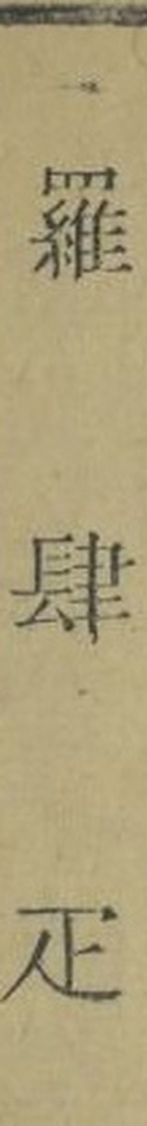羅肆疋
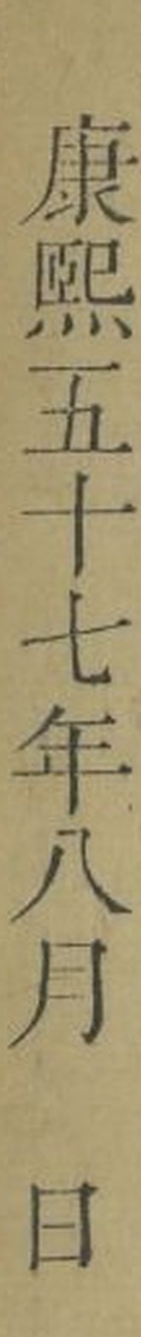康煕五十七年八月日

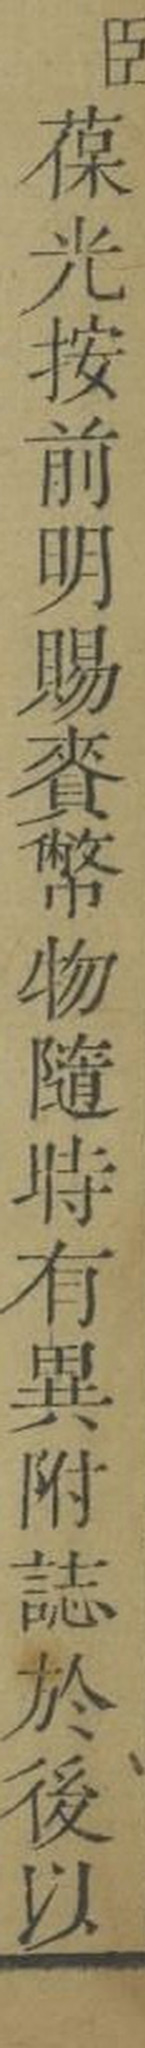臣葆光按前明賜賚幣物隨時有異附誌於後以
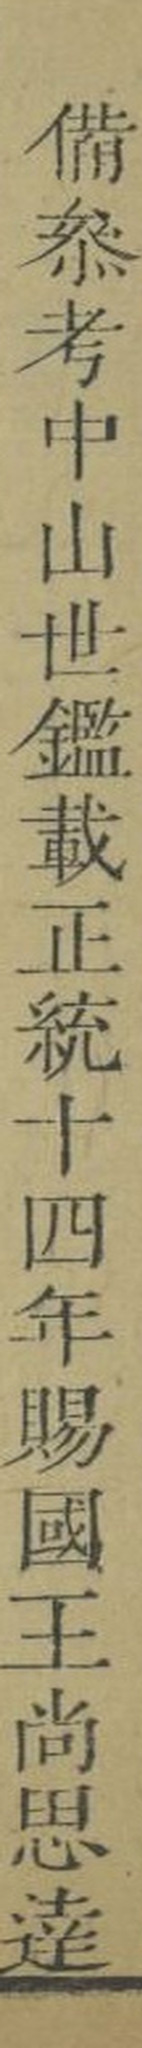備叅考中山世鑑載正統十四年賜國王尚思逹
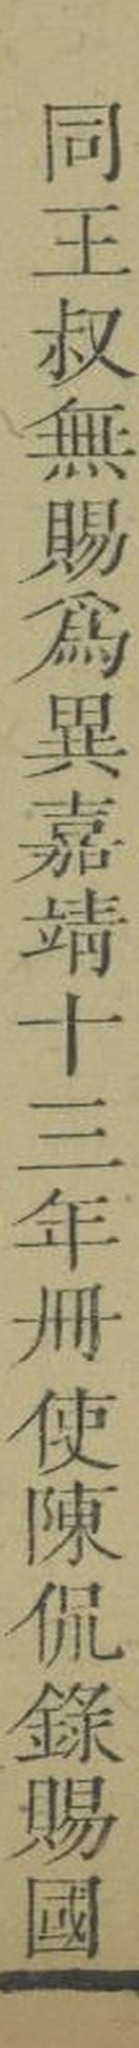同王叔無賜爲異嘉靖十三年册使陳侃錄賜國
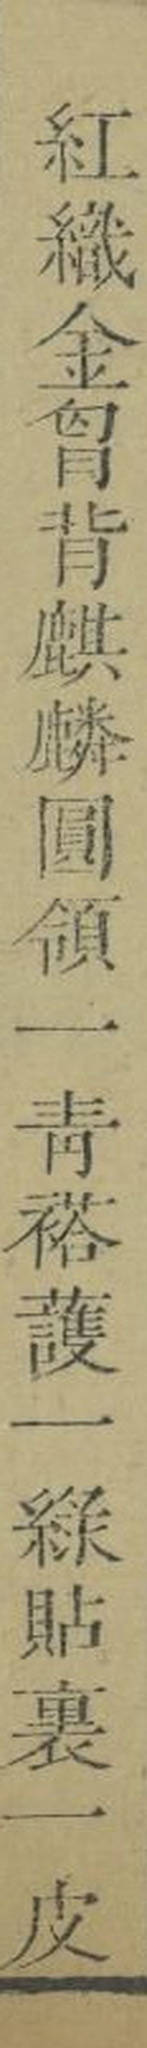紅織金胷背麒麟圓領一靑褡護一綠貼裏一皮
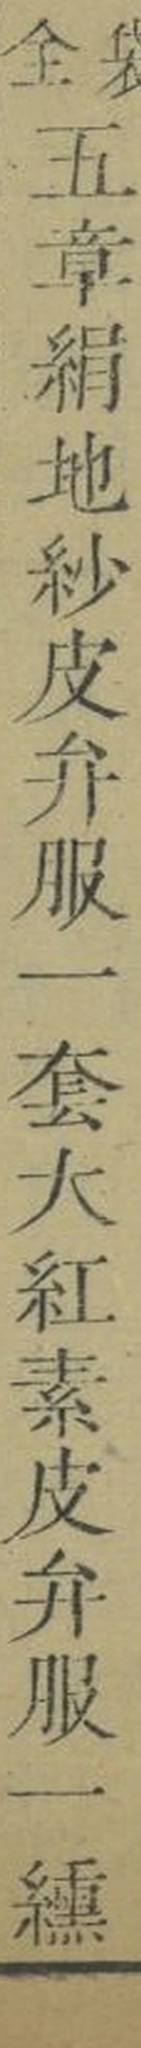袋全五章絹地紗皮弁服一套大紅素皮弁服一纁

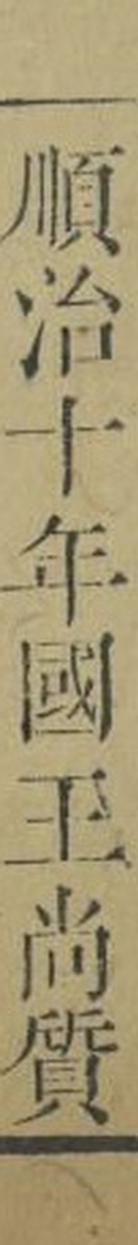順治十年國王尚質
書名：中山伝信録 巻二
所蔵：University of the Ryukyus Library
